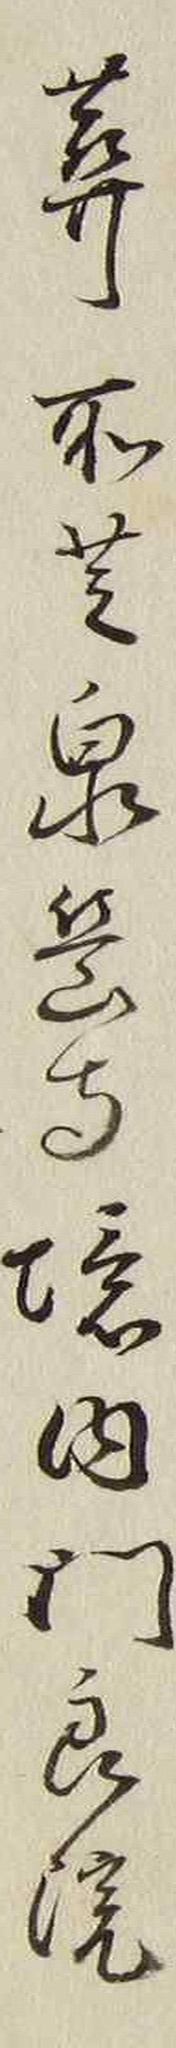葬所芝泉岳寺境内門良院

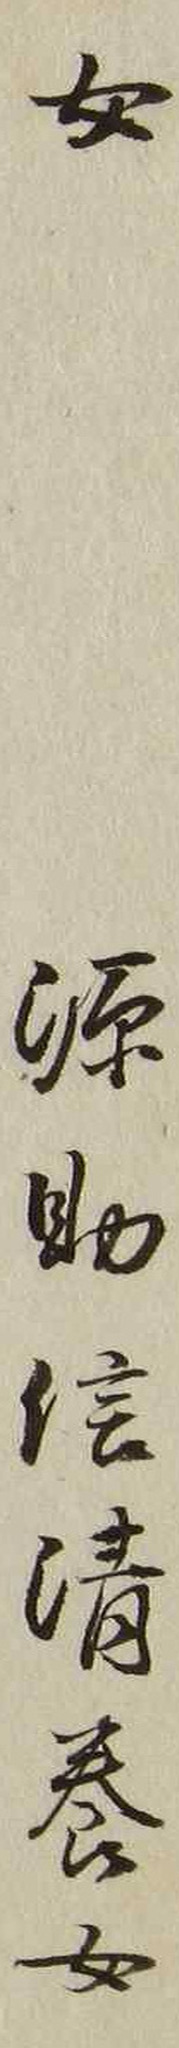女源助信清養女
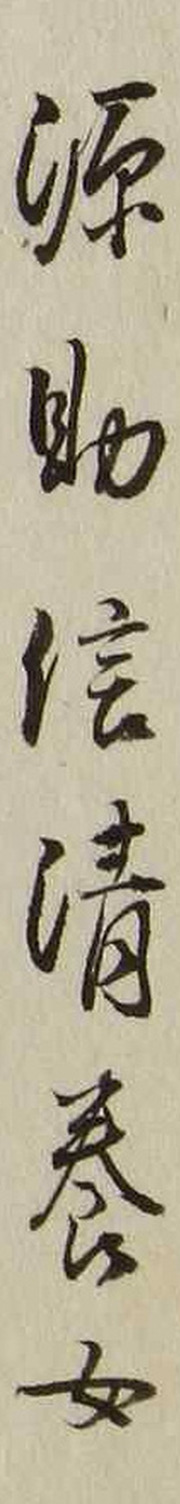女源助信清養女
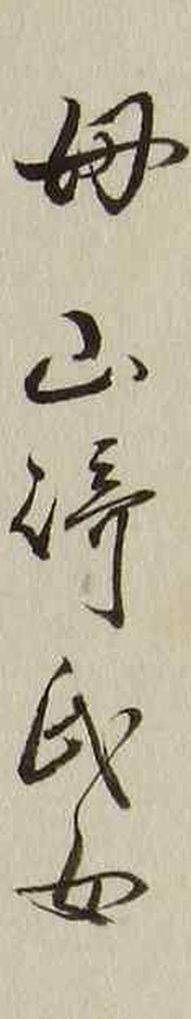母山崎氏女
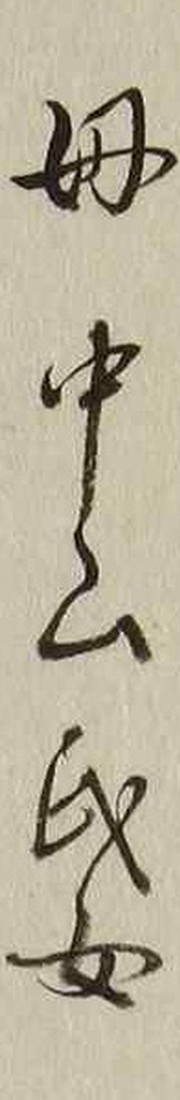母中山氏女
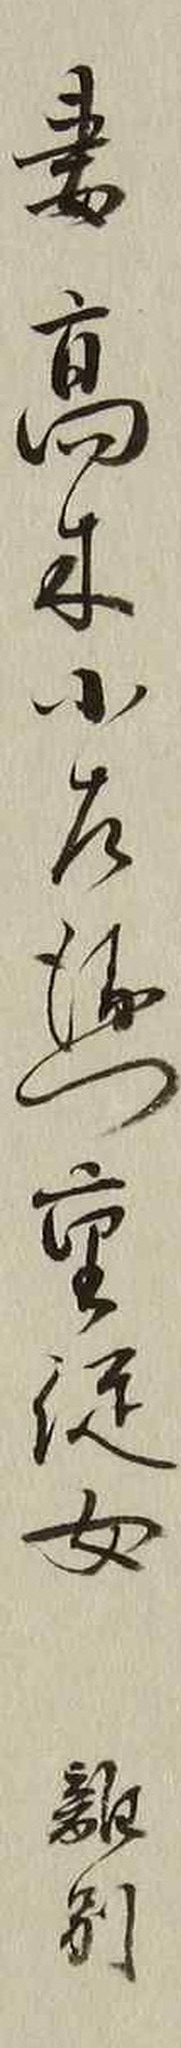妻高木小左治門重従女離別
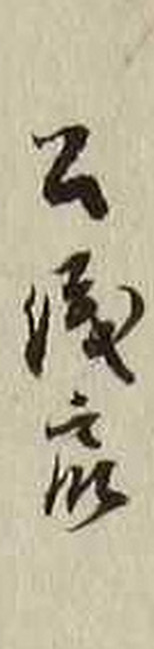公儀衆
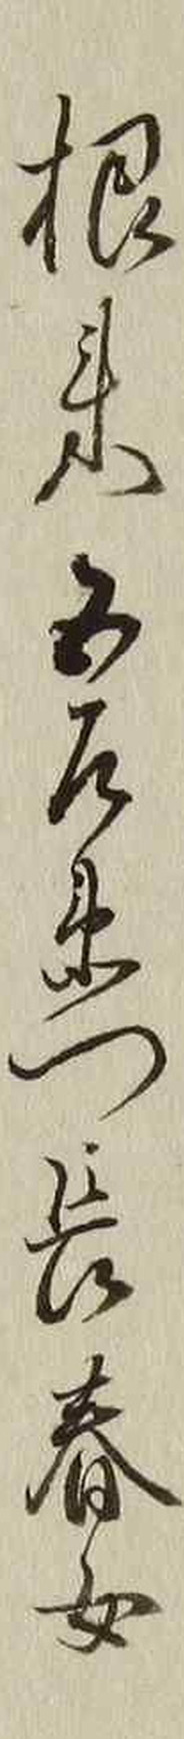根来五左衛門長春女
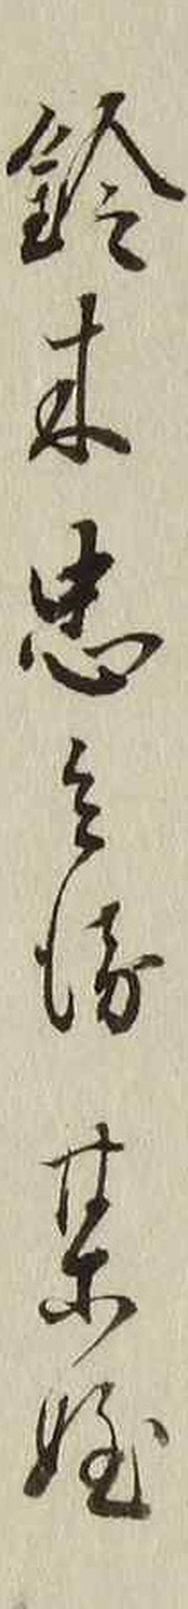鈴木忠兵衛某姪
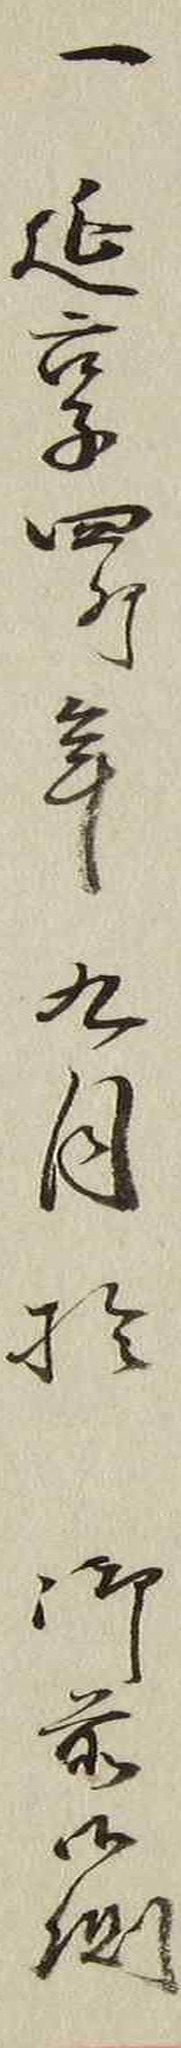一延享四卯年九月於御前御側
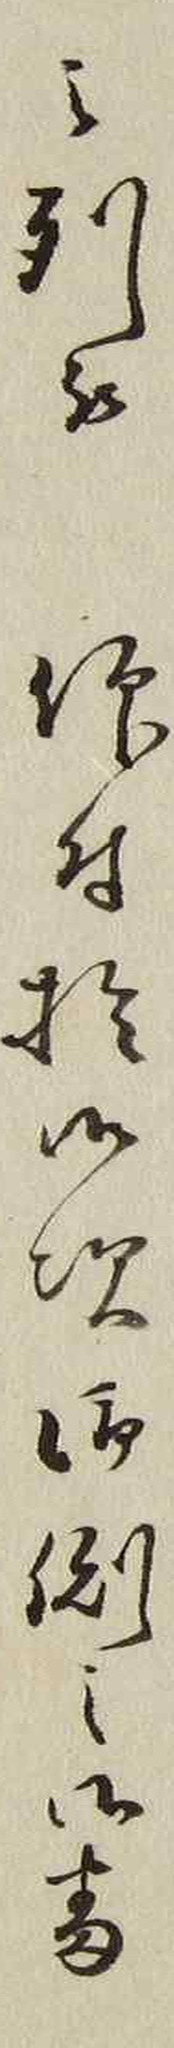之列被仰付於御次御側之御番
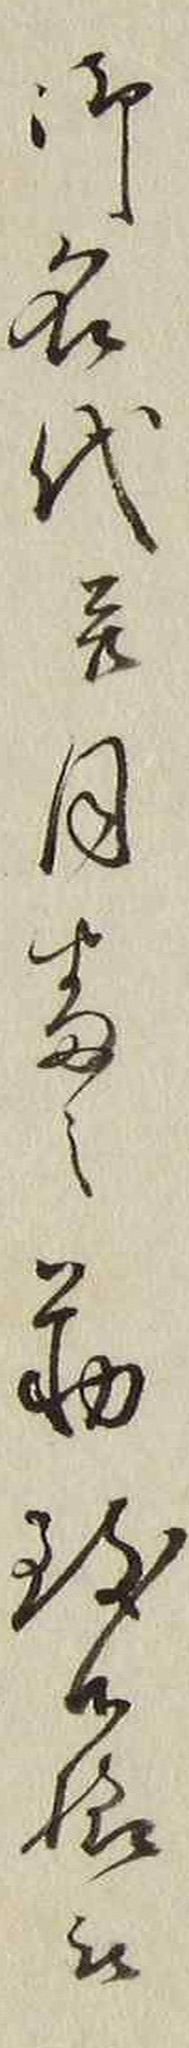御名代并月番之勤致候様被
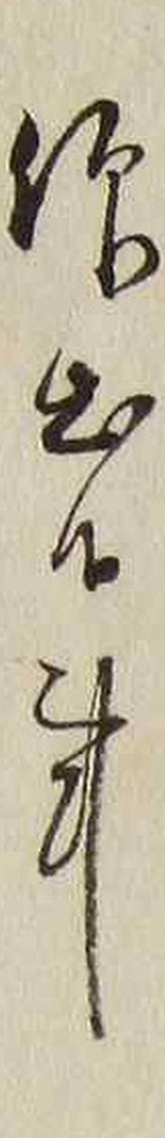仰出候事
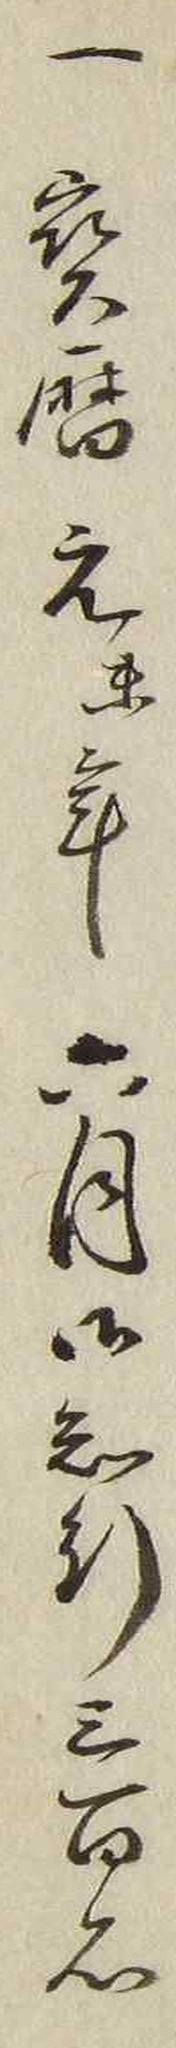一宝暦元未年六月御知行三百石

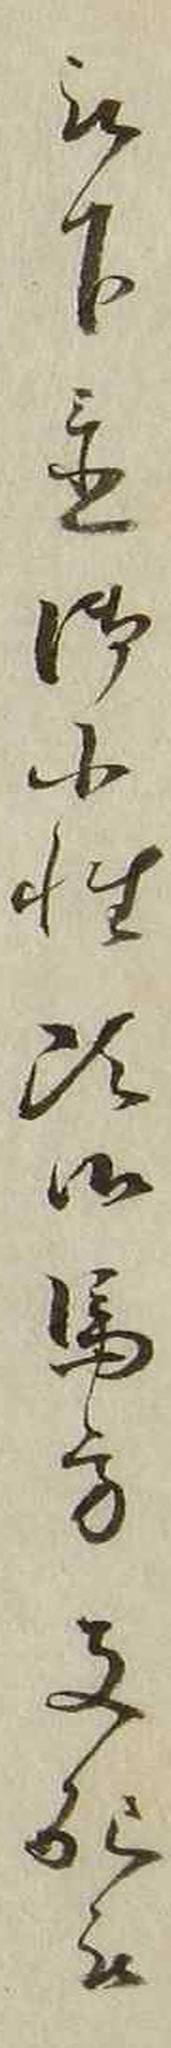被下置御小姓頭御馬方支配被
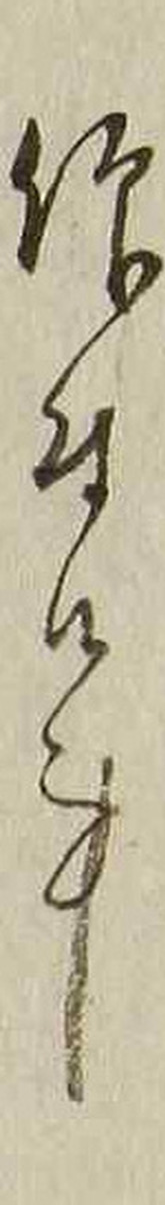仰付候事
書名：諸士系譜　巻之159　な之部1
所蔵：会津若松市立会津図書館
